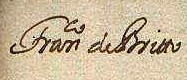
Franco de Britto
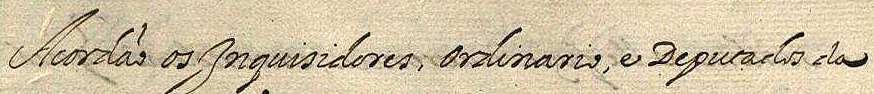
Acordaõ os Jnquisidores, ordinario, e Deputados da
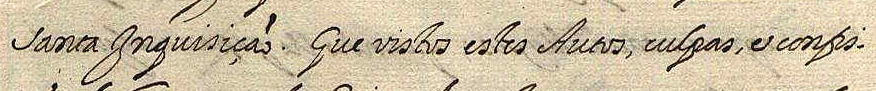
santa Jnquisiçaõ. Que vistos estes Autos, culpas, e confis
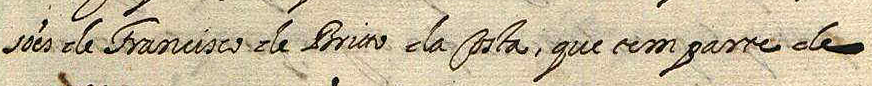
soẽs de Francisco de Britto da Costa, que tem parte de
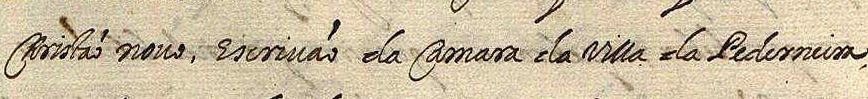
Christaõ nouo, Escriuaõ da Camara da villa da Pederneira,
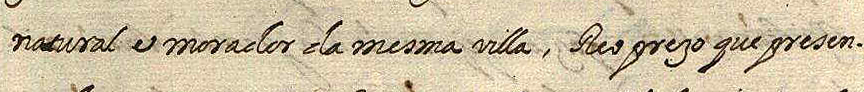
natural e morador da mesma villa, Reo prezo que presen
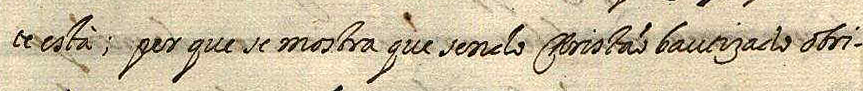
te está; per que se mostra que sendo Christaõ bautizado obri
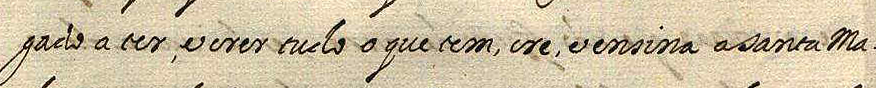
gado a ter, e crer tudo o que tem, cre, e ensina a santa Ma
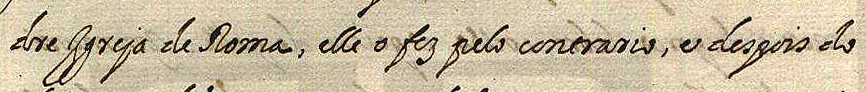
dre Jgreja de Roma, elle o fez pelo contrario, e despois do
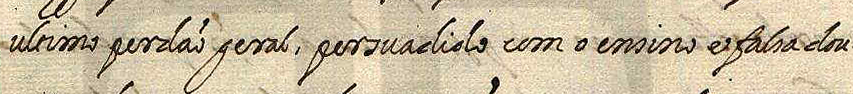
ultimo perdaõ geral, persuadido com o ensino e falsa dou
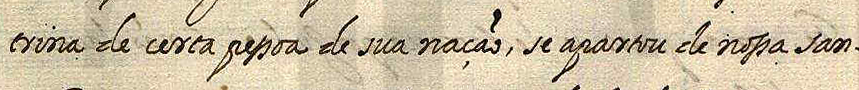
trina de certa pessoa de sua naçaõ, se apartou de nossa san
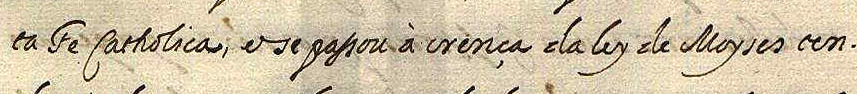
ta Fe Catholica, e se passou à crença da ley de Moyses ten
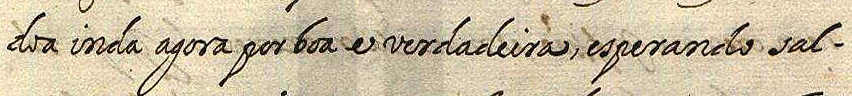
do ainda agora por boa e verdadeira, esperando sal
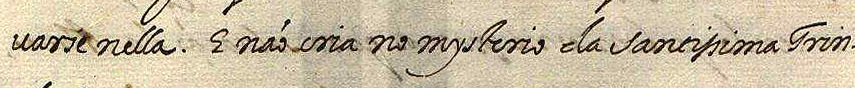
uarse nella. E naõ cria no mysterio da santissima Trin
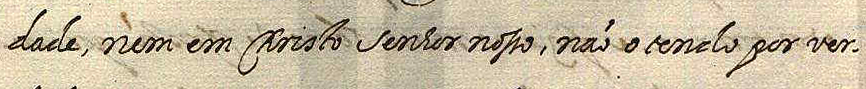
dade, nem em Christo Senhor nosso, naõ o tendo por ver
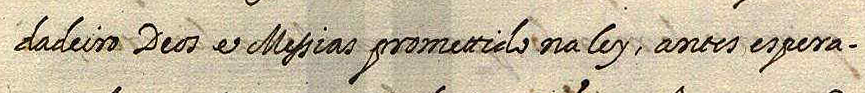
dadeiro Deos, e Messias promettido na ley, antes espera
